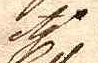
Ag.o
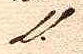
d.o
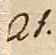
21.
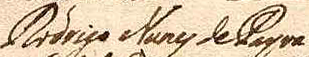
Rodrigo Nunes de Payva
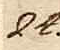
24.
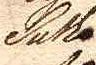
Iulho
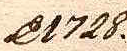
d̄ 1728.
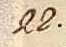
22.
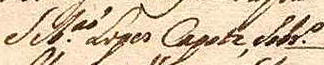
Seb.aõ Lopes Capote, Sobr.o
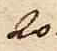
20.
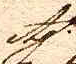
Ag.o
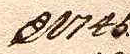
d̄ 1745
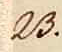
23.
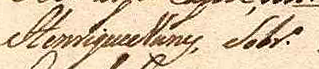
Henrique Nunes, Sobr.o
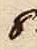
8.
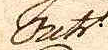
Outr.o
